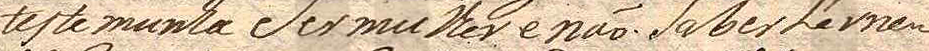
testemunha Ser mulher e não saber Ler nen
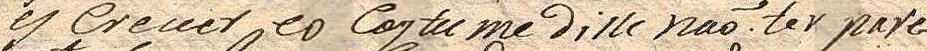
escreuer e o Costume disse naõ ter pare
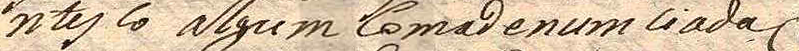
ntesco algum Com a denumciada
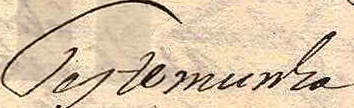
Testemunha
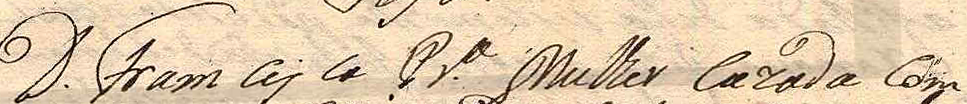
D. Francisca Pr.a Mulher Cazada Com
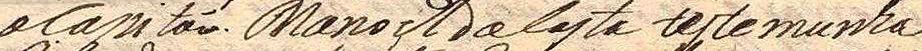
o Capitão. Manoel da Costa testemunha
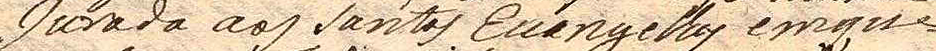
Jurada aos santos Euangelhos em que
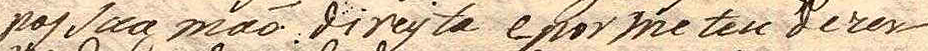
pos sua maõ direyta e pormeteu dezer
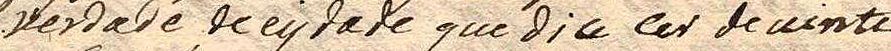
verdade de eydade que dice cer de uinte
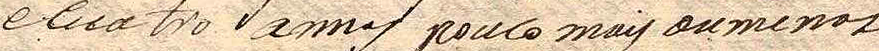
e cuatro annos pouco mais ou menoz
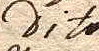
Dito
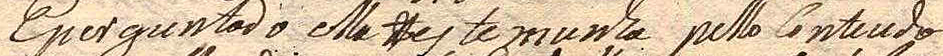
E perguntado ella testemunha pello Conteudo
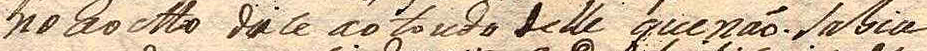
no aoctto dice ao toudo delle que naõ sabia
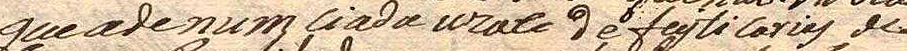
que a denumciada uzace de feyticarias de
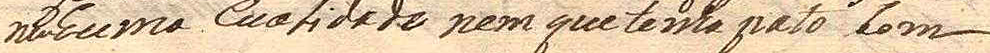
nenhuma cuaLidade nem que tenha pato Com
